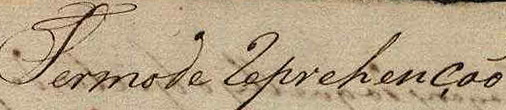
Termo de Reprehençaõ
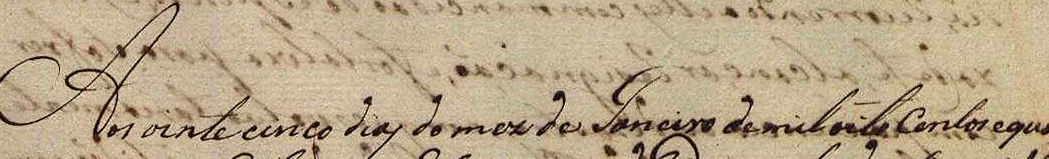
Aos vinte cinco dias do mez de Ianeiro de mil oito Centos e qua
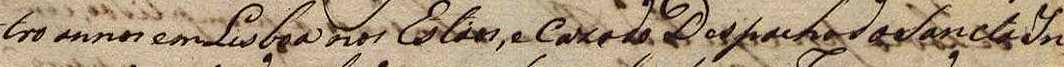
tro annos em Lisboa nos Estaos, e Caza do Despacho da Sancta In
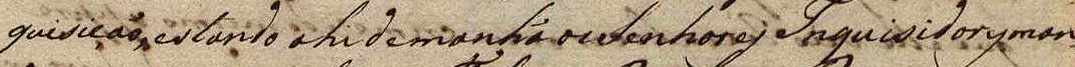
quisiçaõ, estando ahi de manhã os Senhores Inquisidores man
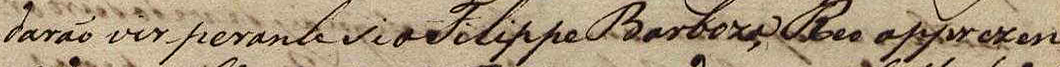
daraõ vir perante si a Filippe Barboza, Reo apprezen
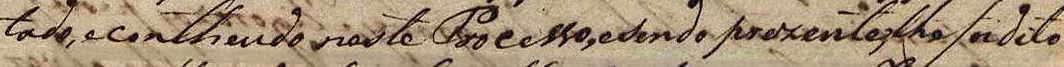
tado, e contheudo neste Processo, e sendo prezente, lhe foi dito
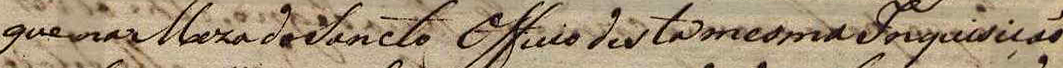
que na Meza do Sancto Officio desta mesma Inquisiçaõ
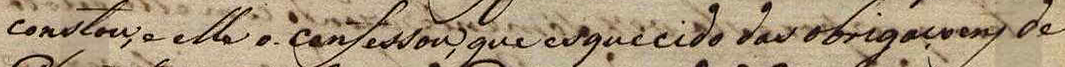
constou, e elle o confessou, que esquecido das obrigaçoens de
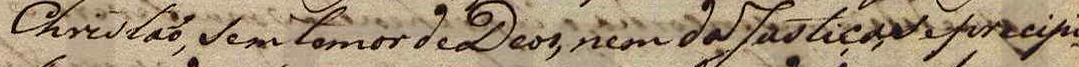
Christaõ, sem temor de Deos, nem da Justiça, se precipi
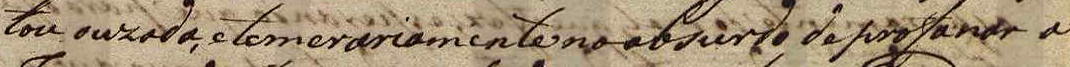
tou ouzada, e temerariamente no absurdo de profanar a
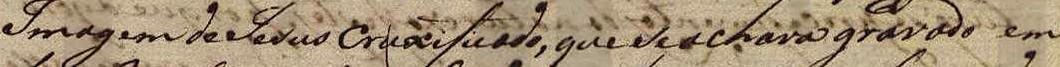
Imagem de Jesus Cruxificado, que se achava gravado em
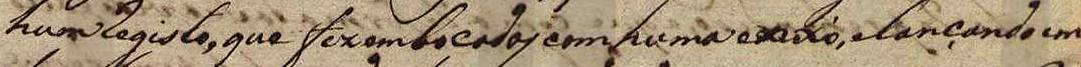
hum Registo, que fez em bocados com huma enxó, e lançando em
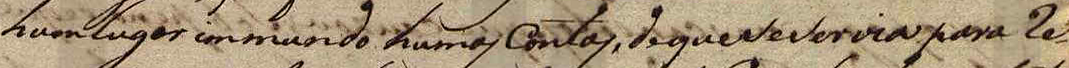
hum lugar immundo humas contas, de que se servia para Re
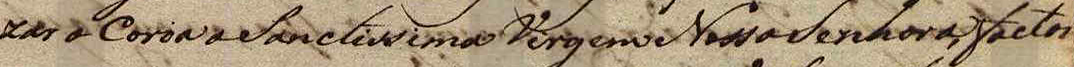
zar a Coroa a Sanctissima Virgem Nossa Senhora, factos
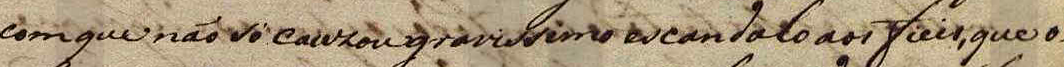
com que naõ só cauzou gravissimo escandalo aos fieis, que o
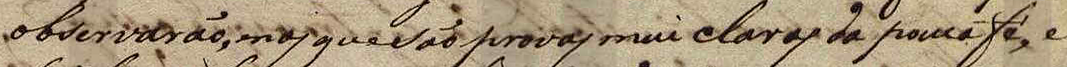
observaraõ, mas que saõ provas mui claras da pouca fé, e
